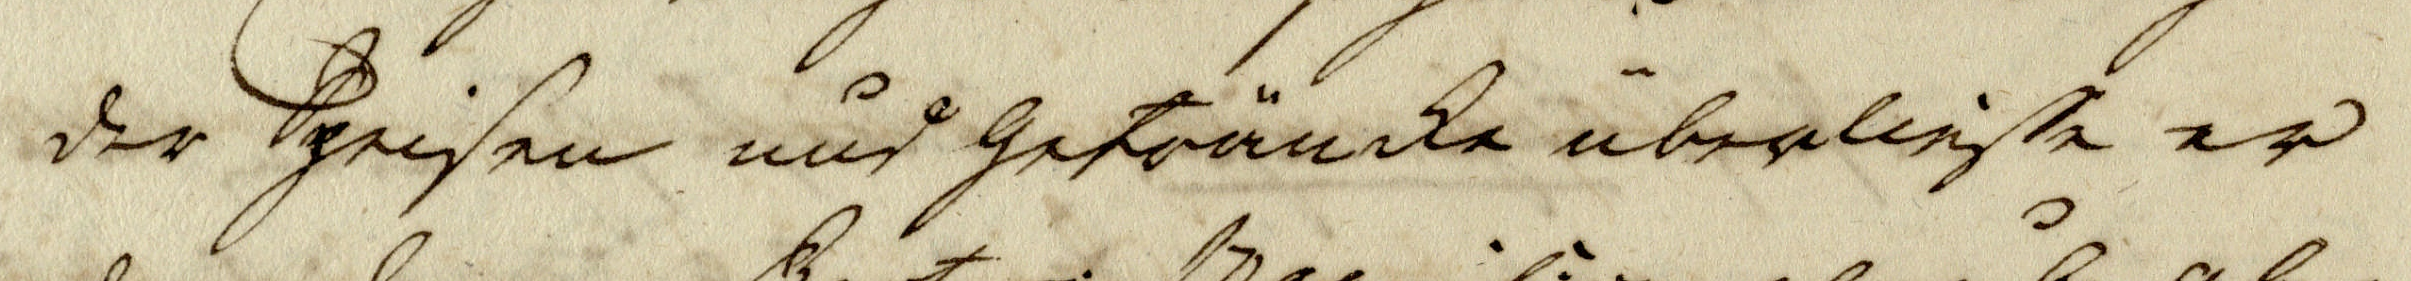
der Speisen und Geträncke überliesse er
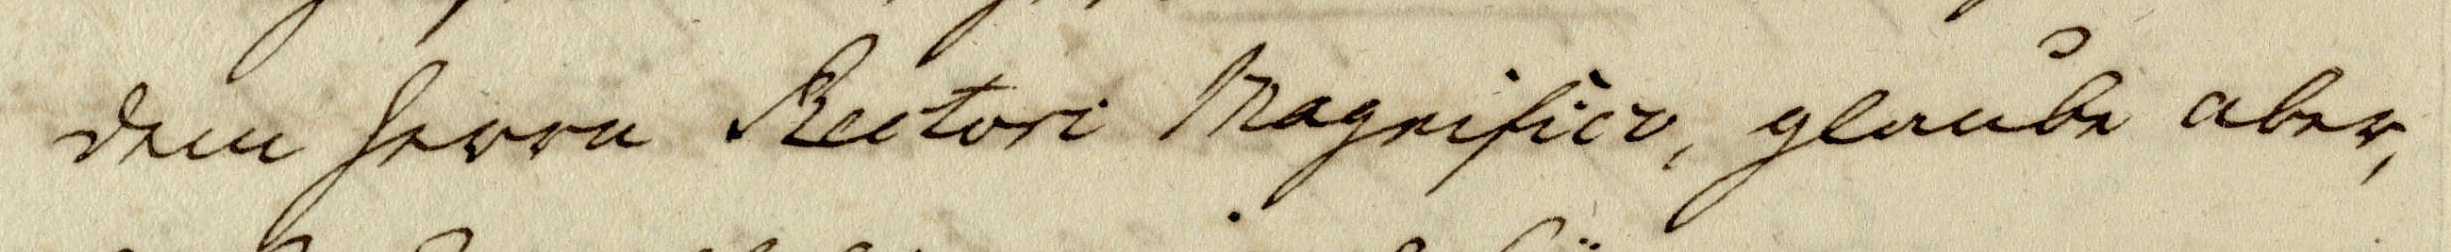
dem Herrn Rectori Magnifico, glaube aber
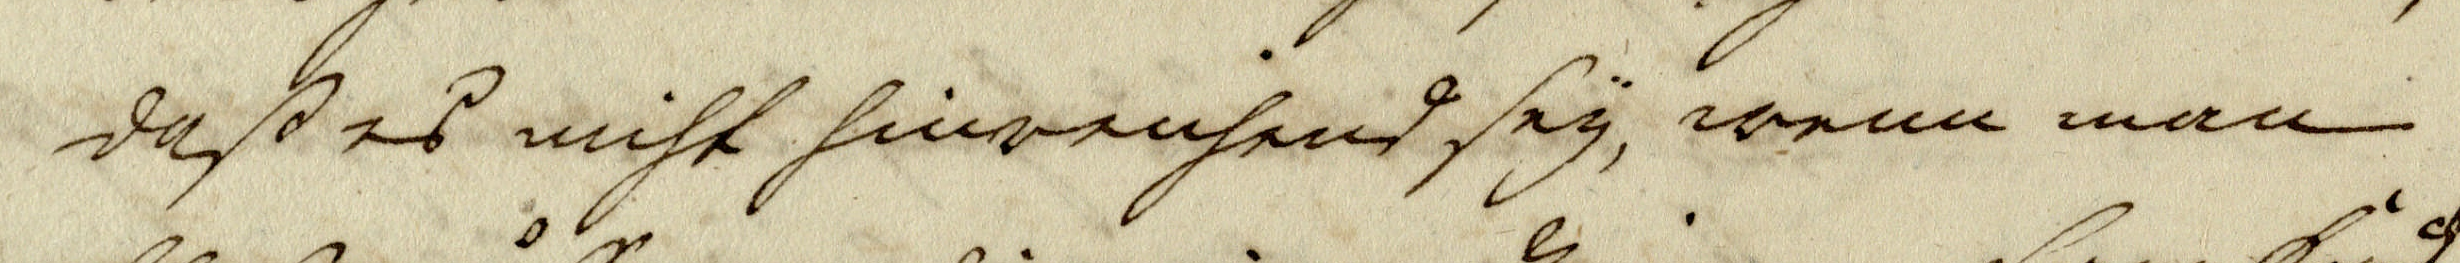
daß es nicht hinreichend seÿ, wenn man
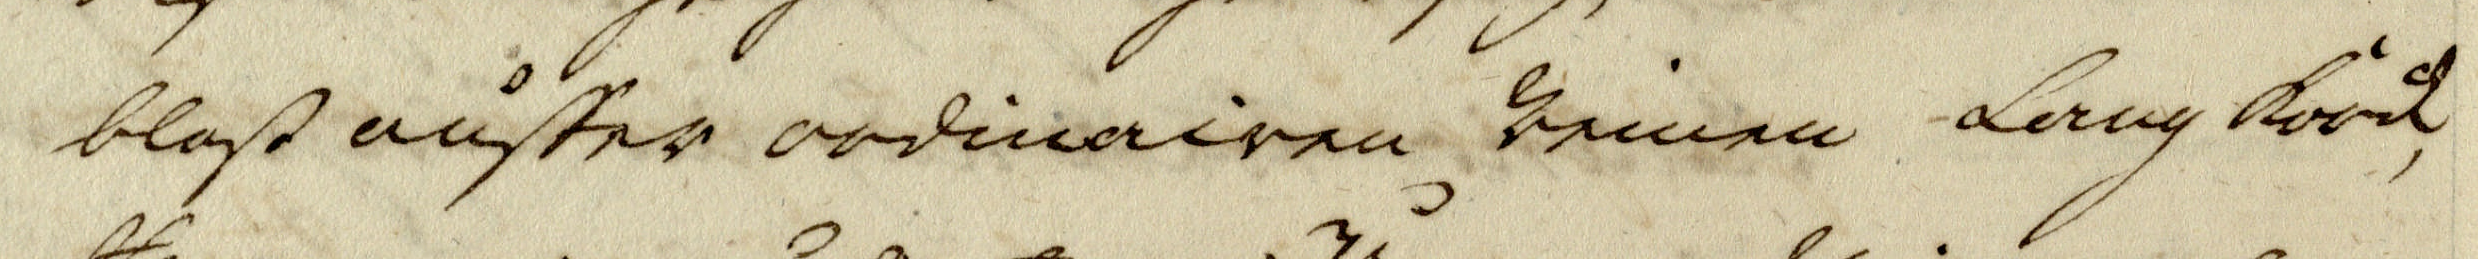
bloß ausser ordinairen Weinen Lang Korck
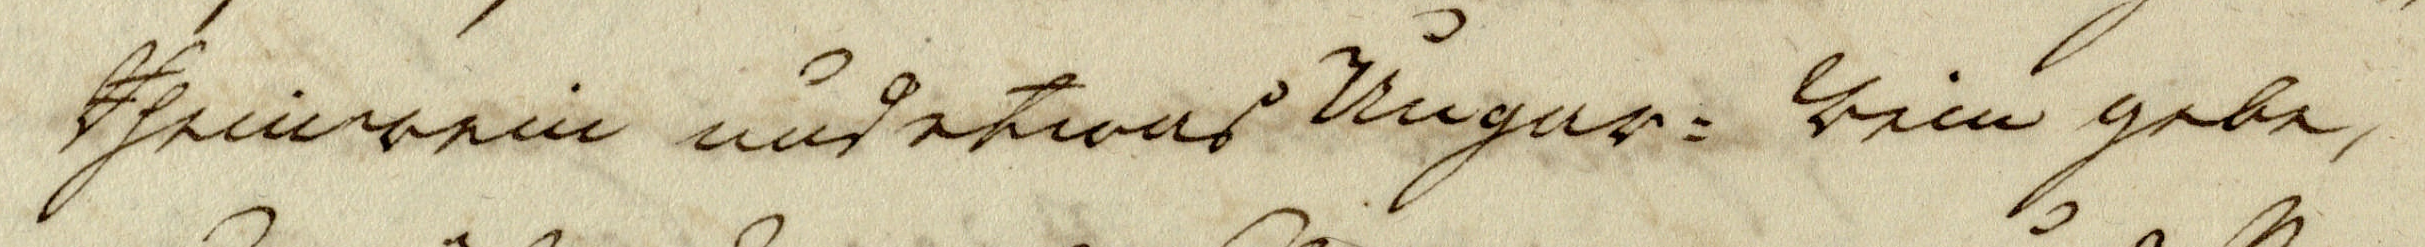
Rheinwein und etwas Ungar- Wein gebe,
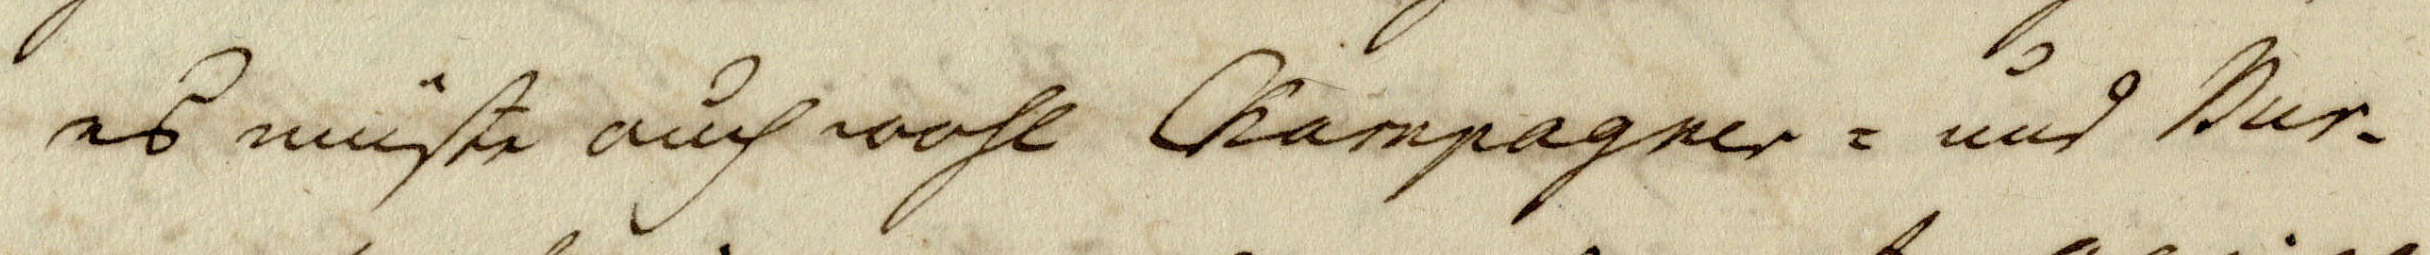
es müßte auch wohl Champagner- und Bur¬
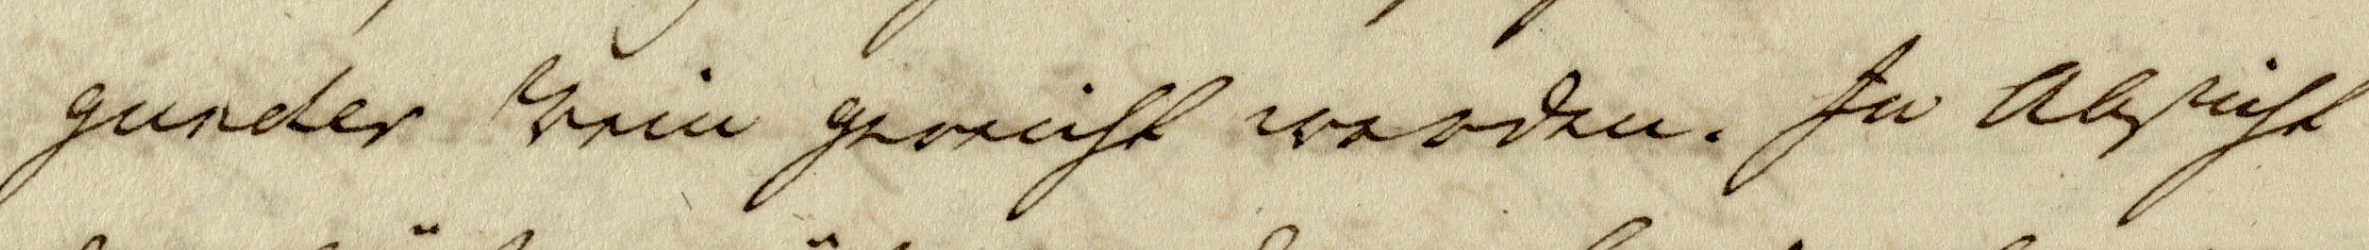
gunder Wein gereicht werden. In Absicht
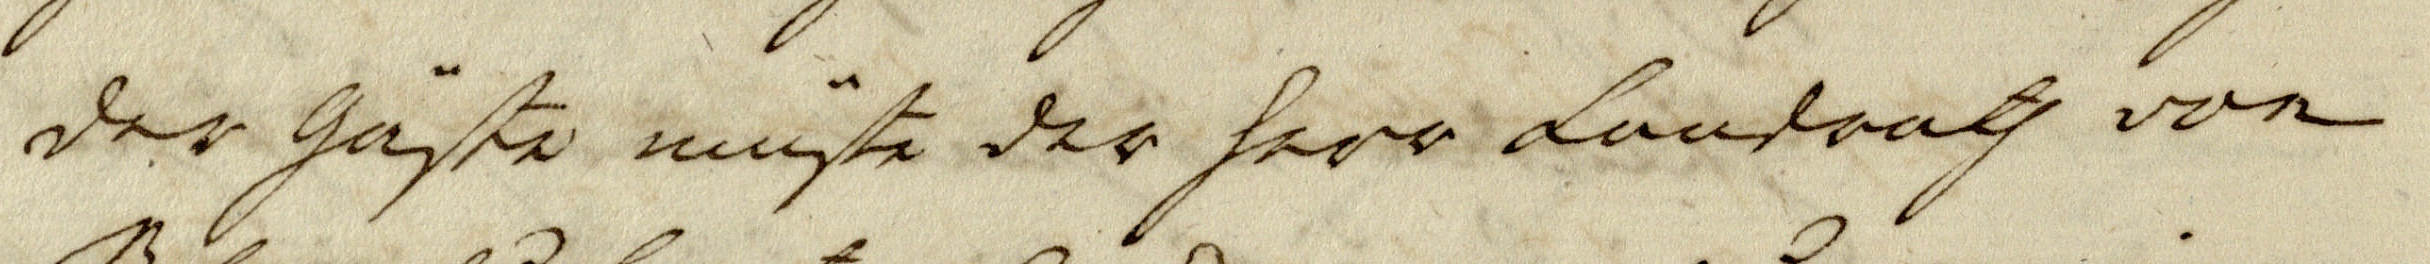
der Gäste müßte der Herr Landrath von
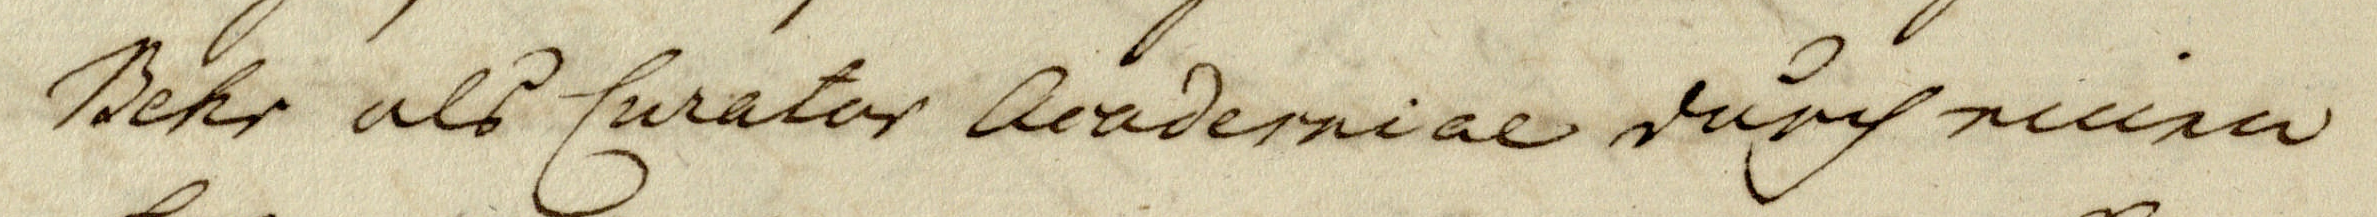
Behr als Curator Academiae durch einen
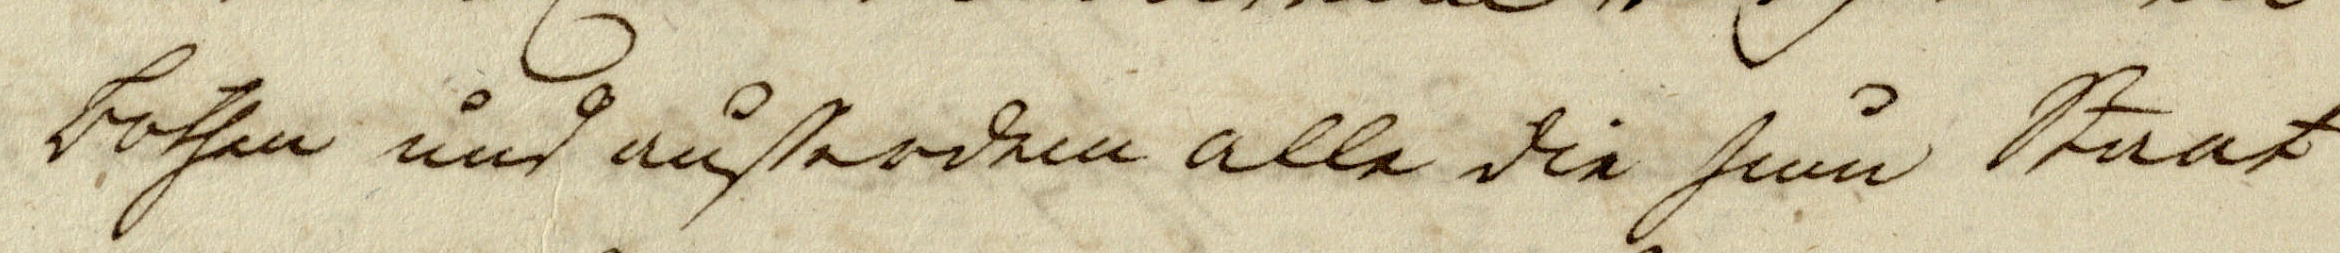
Bothen und ausserdem alle die zum Staat
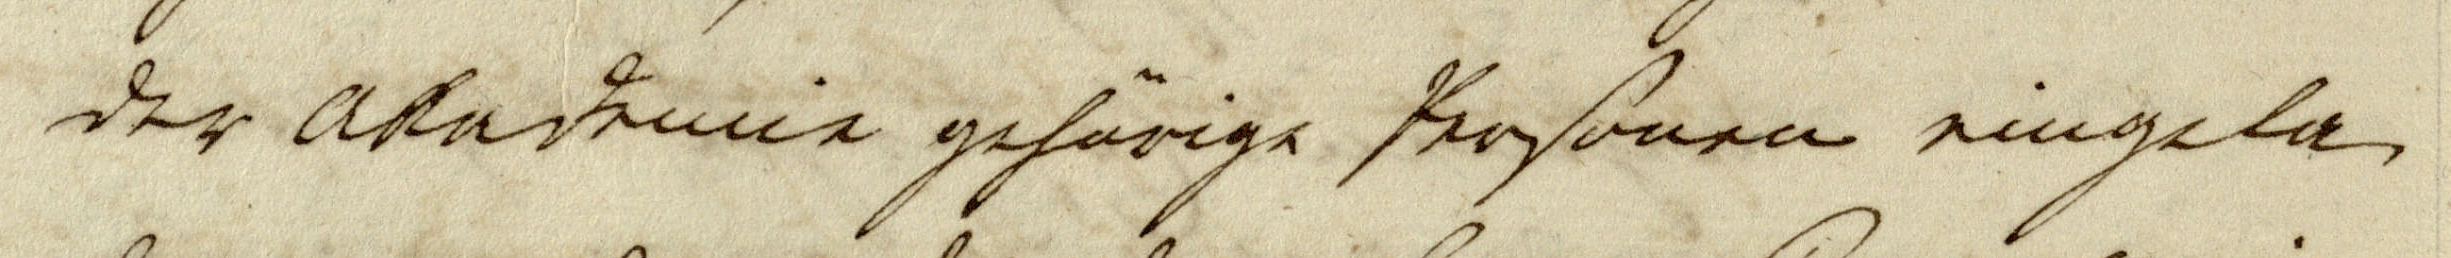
der Akademie gehörige Personen eingela¬
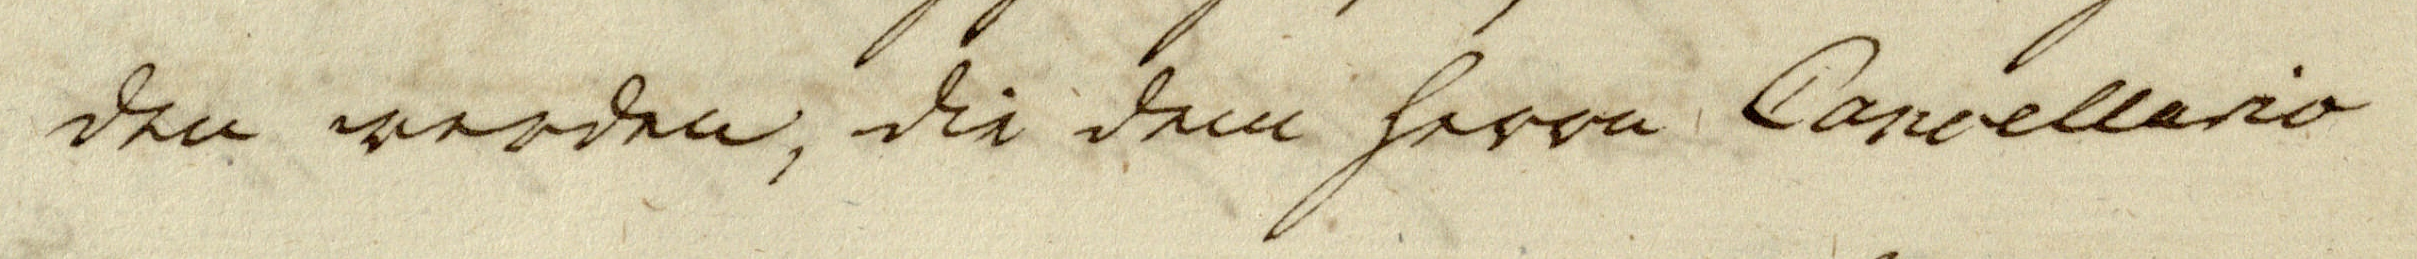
den werden, die dem Herrn Cancellario
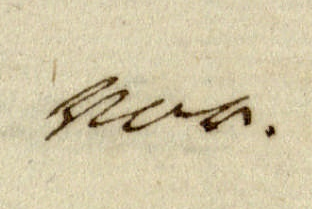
vor¬
